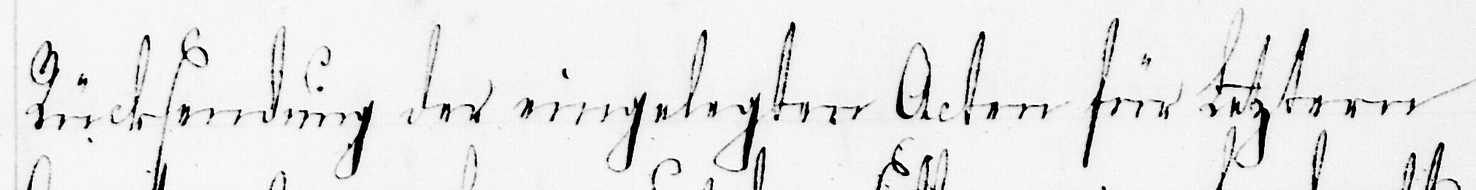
Rücksendung der eingelegten Acten für Letztern
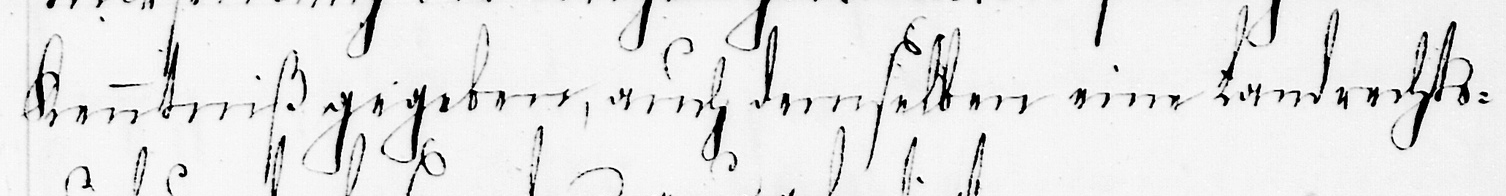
Kenntniß gegeben, auch demselben eine Landrechts¬
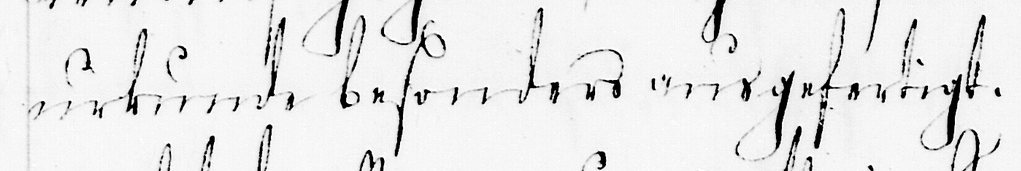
urkunde besonders ausgefertigt.
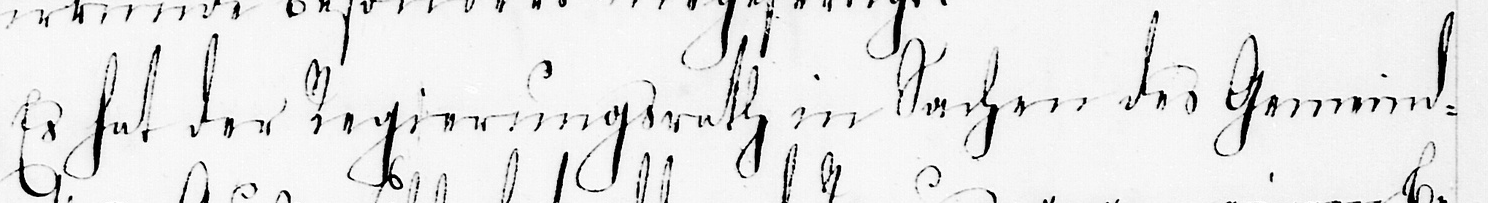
Es hat der Regierungsrath in Sachen des Gemeind¬
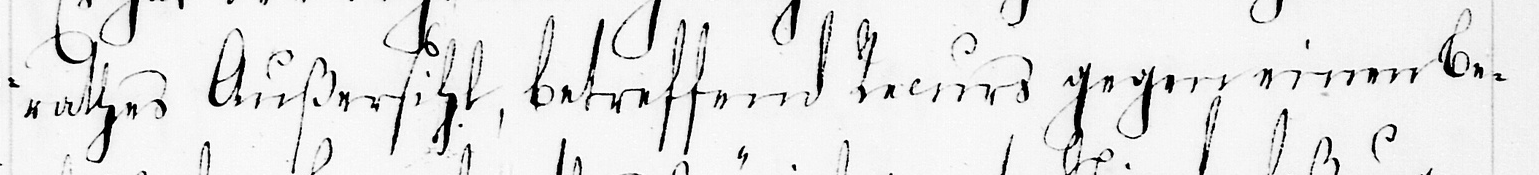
rathes Außersihl, betreffend Recurs gegen einen Be¬
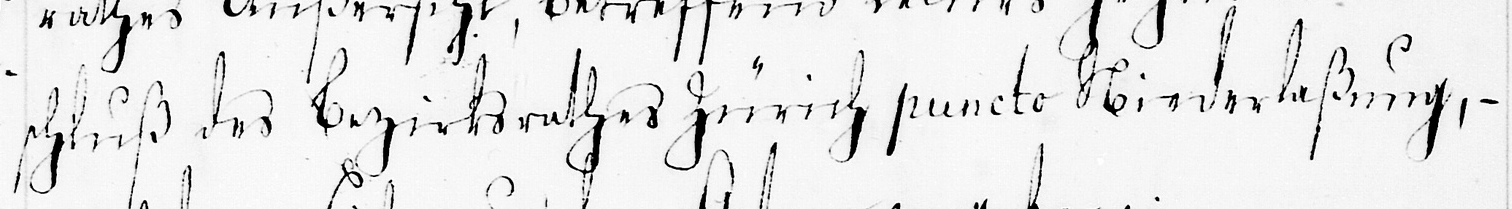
schluß des Bezirksrathes Zürich puncto Niederlaßung, –
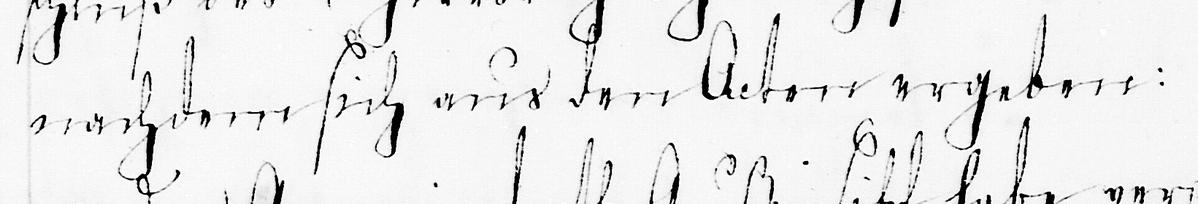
nachdem sich aus den Acten ergeben:
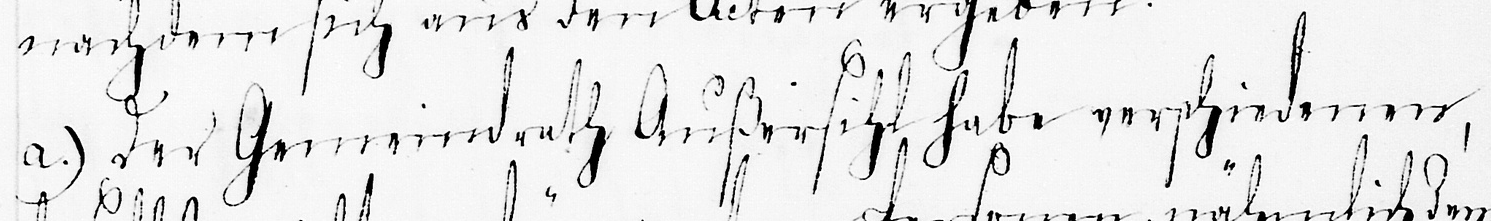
a.) Der Gemeindrath Außersihl habe verschiedenen,
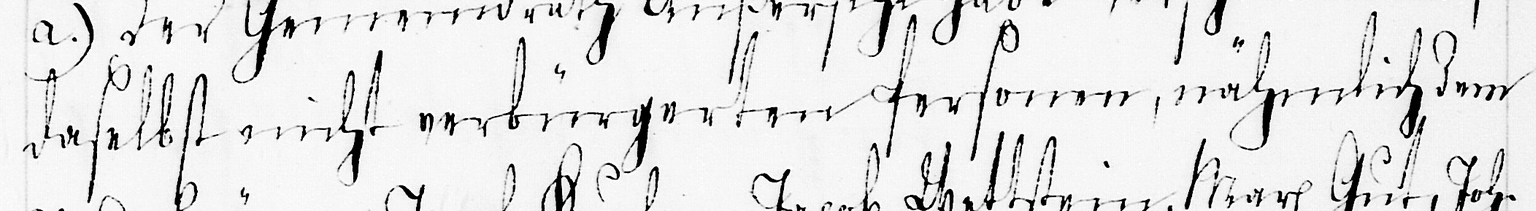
daselbst nicht verbürgerten Personen, nähmlich dem
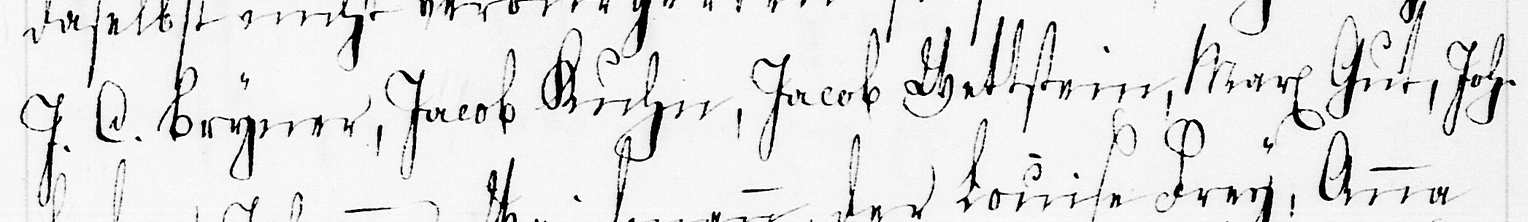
J. C. Bryner, Jacob Kuhn, Jacob Wettstein, Marx Gut, Joh.
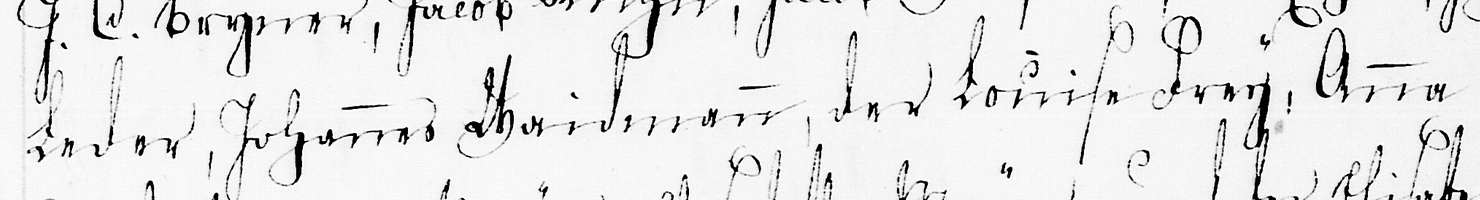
Leder, Johannes Waidmann, der Louise Frey, Anna
